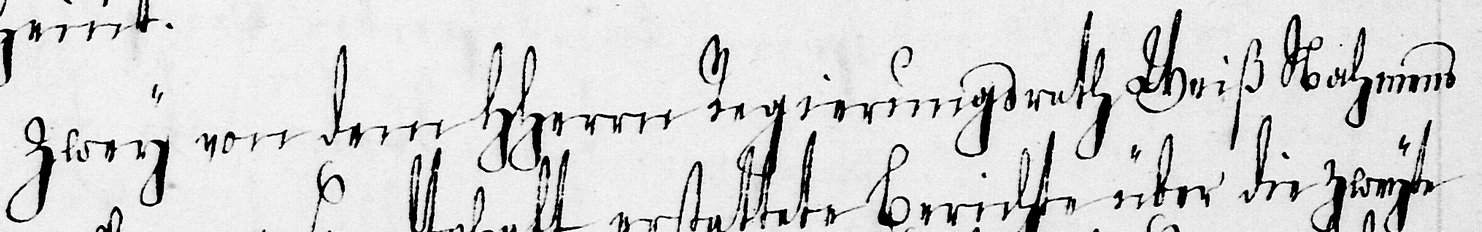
Zwey von dem HHerrn Regierungsrath Weiß Nahmens
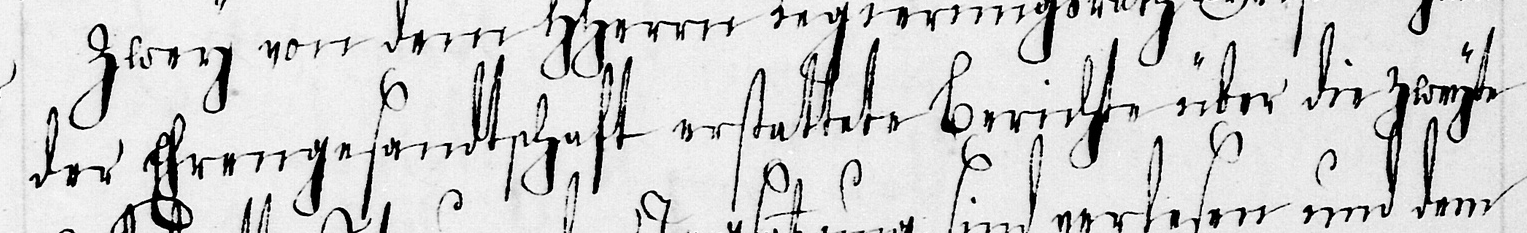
der Ehrengesandtschaft erstattete Berichte über die zweyte
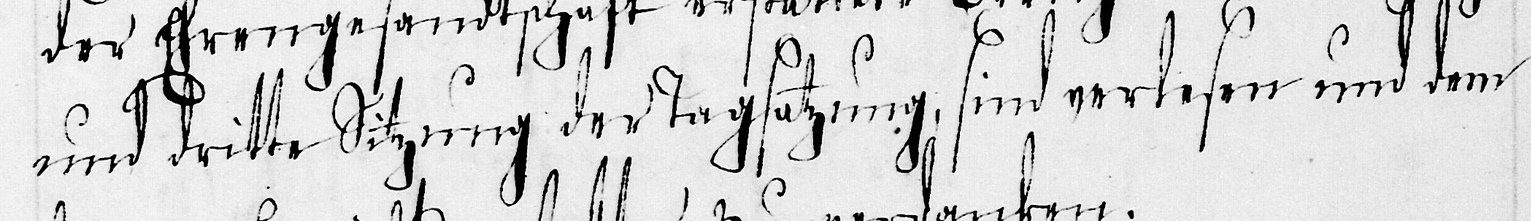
und dritte Sitzung der Tagsatzung, sind verlesen und dem
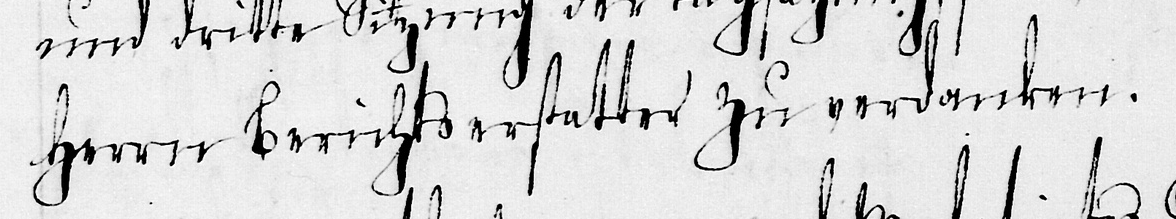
Herrn Berichtserstatter zu verdanken.
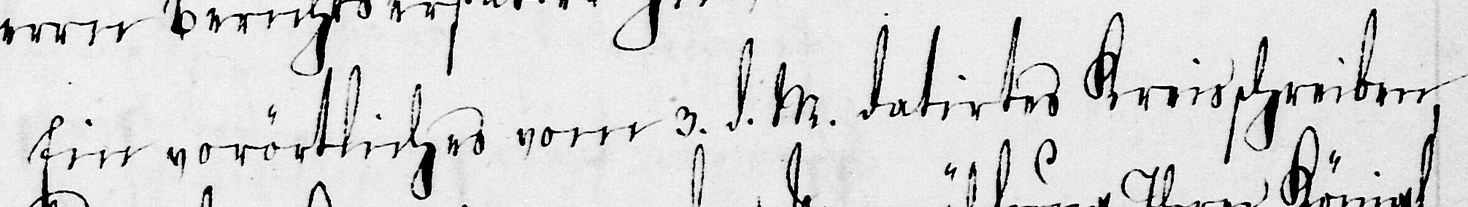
Ein vorörtliches vom 3. d. M. datirtes Kreisschreiben,
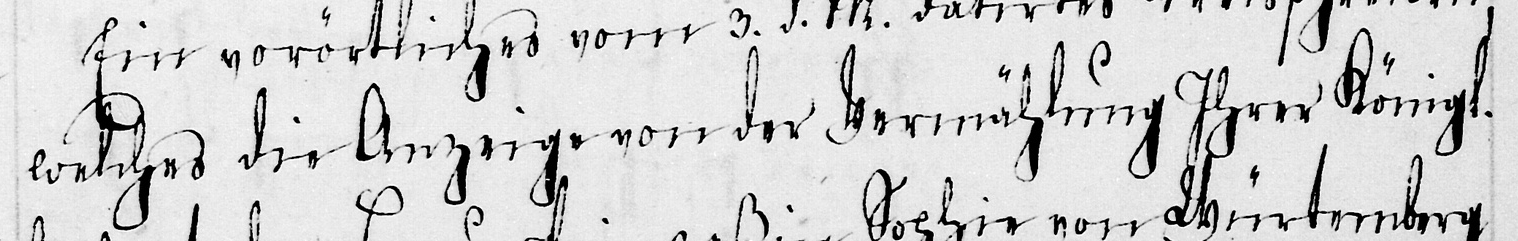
welches die Anzeige von der Vermählung Ihrer Königl.
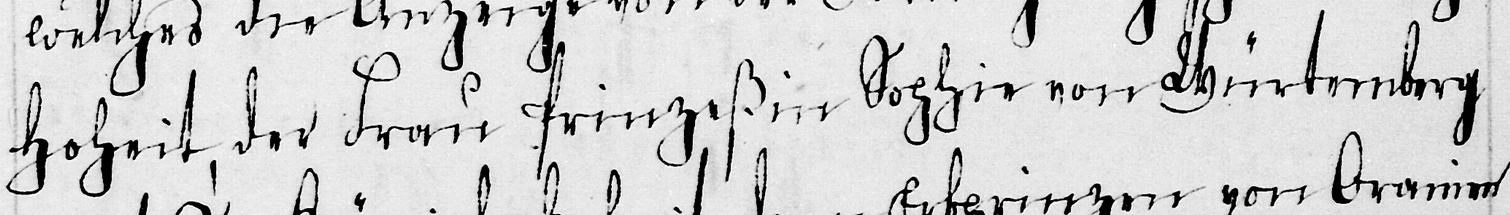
Hoheit, der Frau Prinzeßin Sophie von Würtemberg
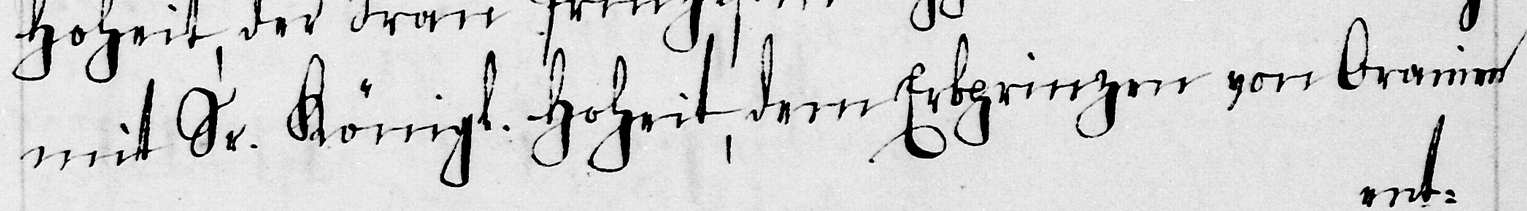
mit Sr. Königl. Hoheit, dem Erbprinzen von Oranien
